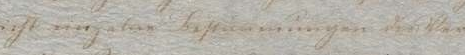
plötzlich gewissermaßen auf dem Wege der
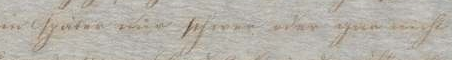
leicht einzelne Bestimmungen des Vertrages,
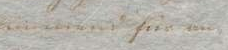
Initiative in der Presse in
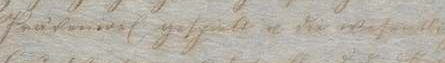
ein später nur schwer oder gar nicht mehr
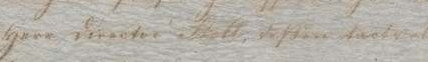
gezeigt, ja geradezu für geboten, daß von unserer
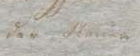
Bestimmungen
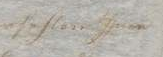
des Baukapitales
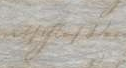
werden.
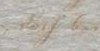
ist, hat es
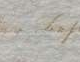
in der
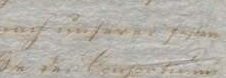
uns entschlossen haben &
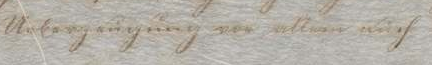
Ueberzeugung vor allem auch im
